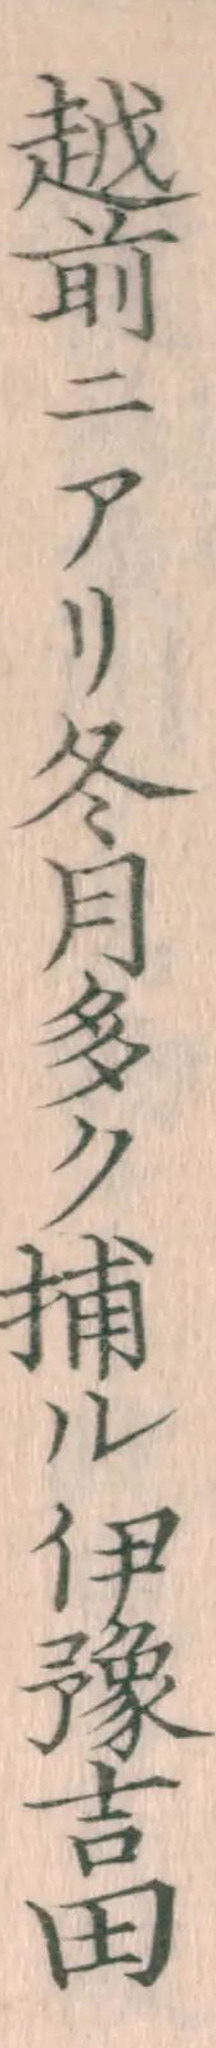越前ニアリ冬月多ク捕ル伊予吉田
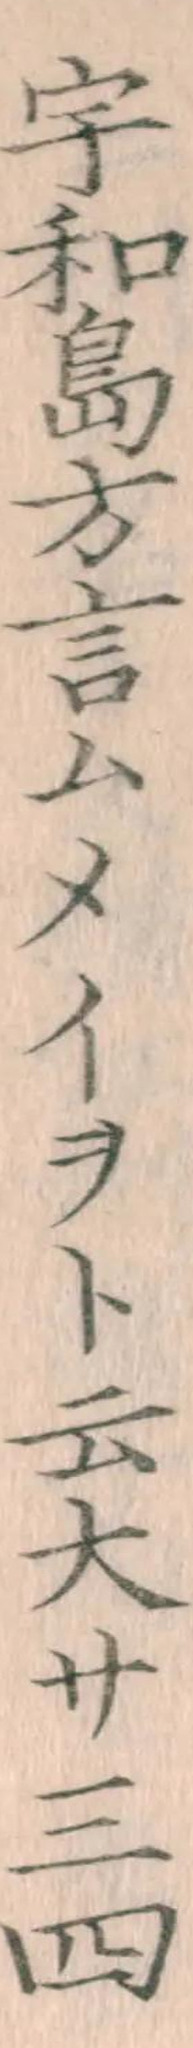宇和島方言ムメイヲト云大サ三四
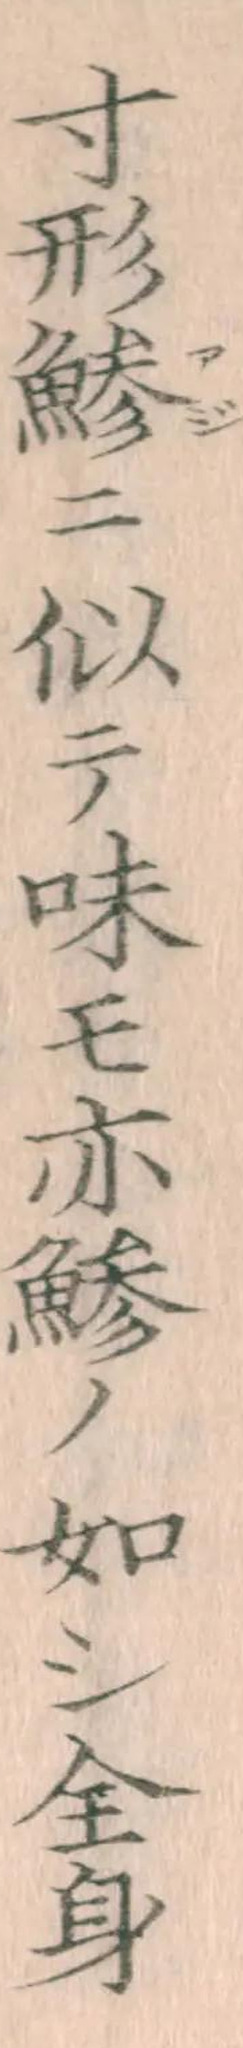寸形鯵ニ似テ味モ亦鯵ノ如シ全身
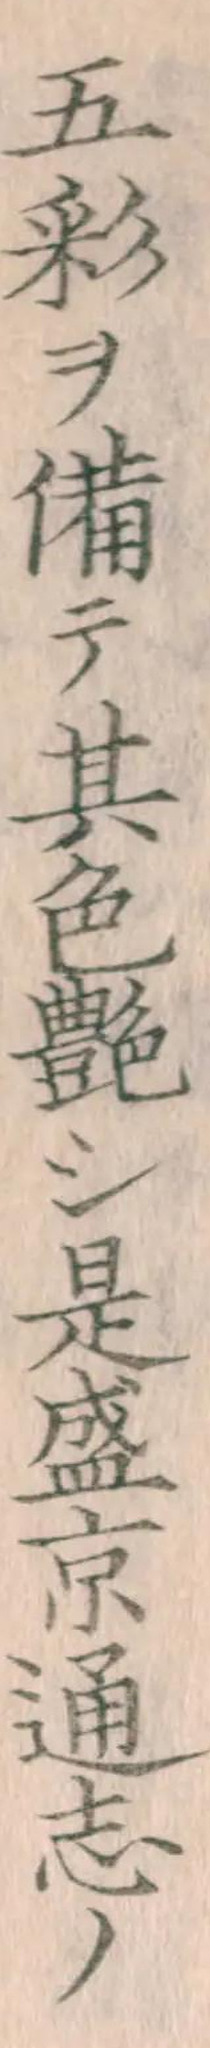五彩ヲ備テ其色艶シ是盛京通志ノ
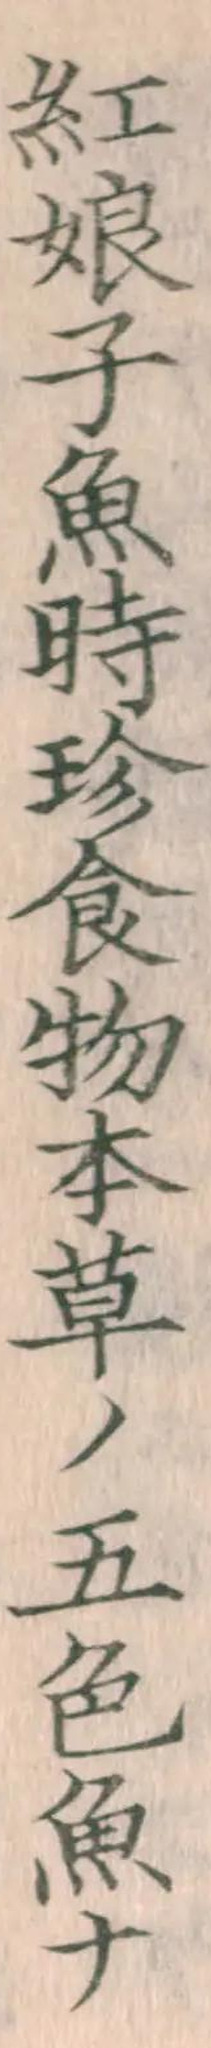紅娘子魚時珍食物本草ノ五色魚ナ
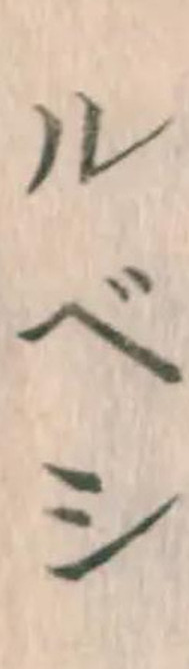ルベシ

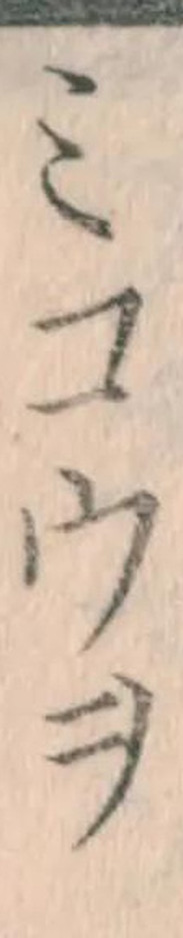ミコウヲ
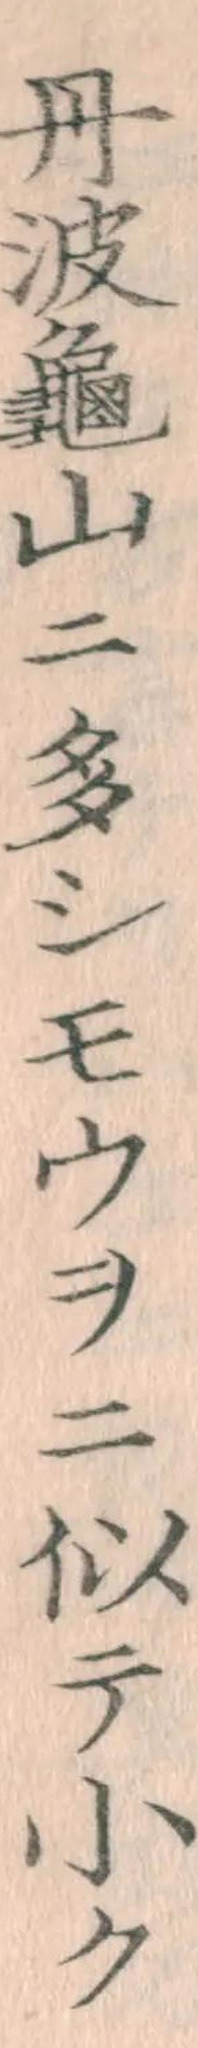丹波亀山ニ多シモウヲニ似テ小ク
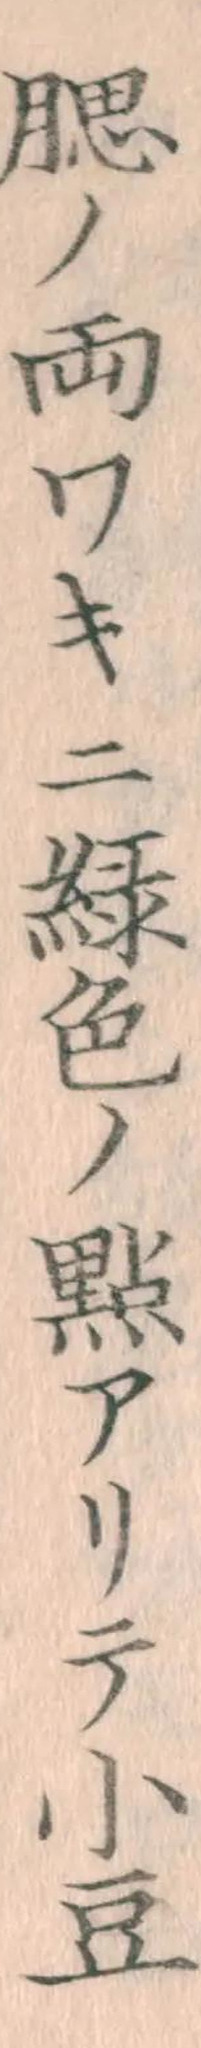腮ノ両ワキニ緑色ノ点アリテ小豆
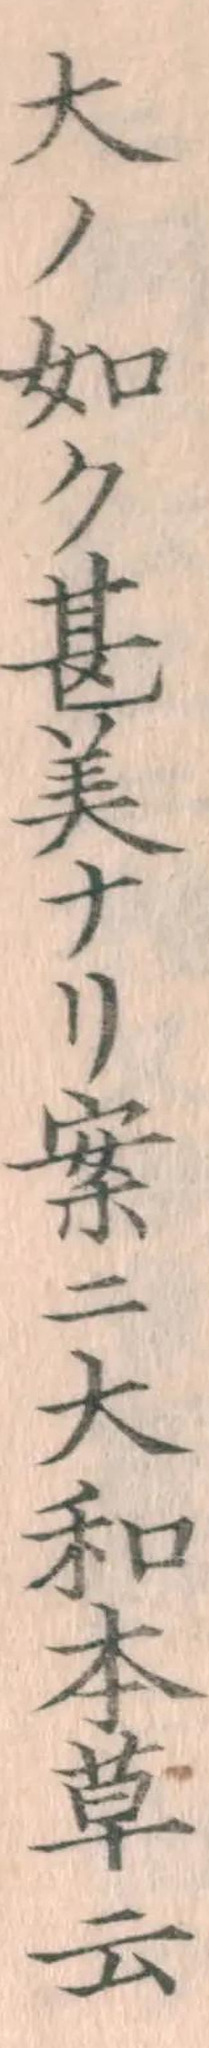大ノ如ク甚美ナリ案ニ大和本草云
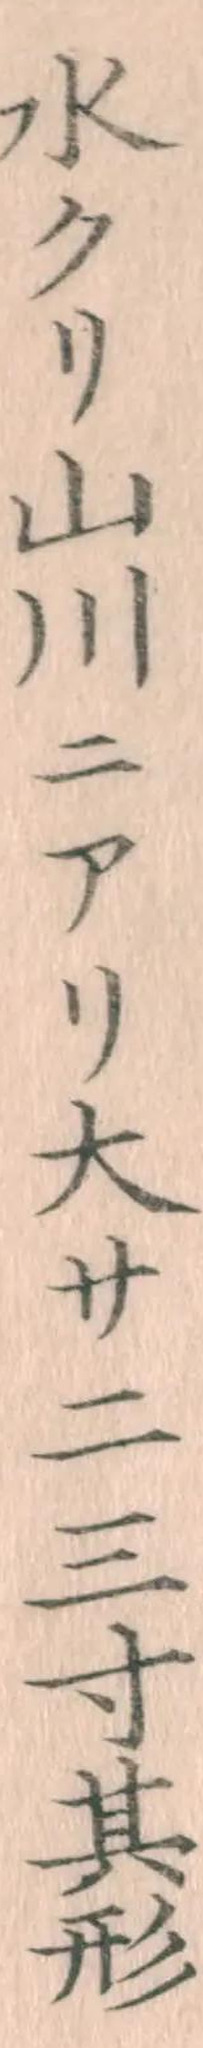水クリ山川ニアリ大サ二三寸其形
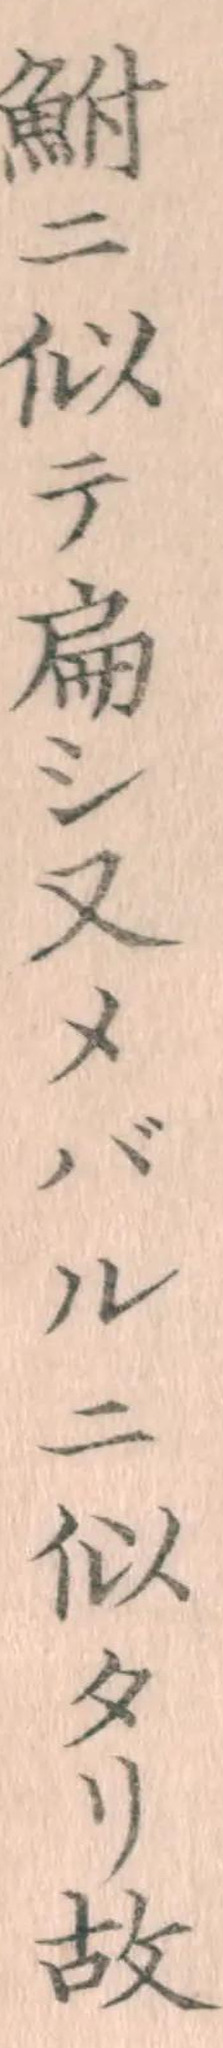鮒ニ似テ扁シ又メバルニ似タリ故
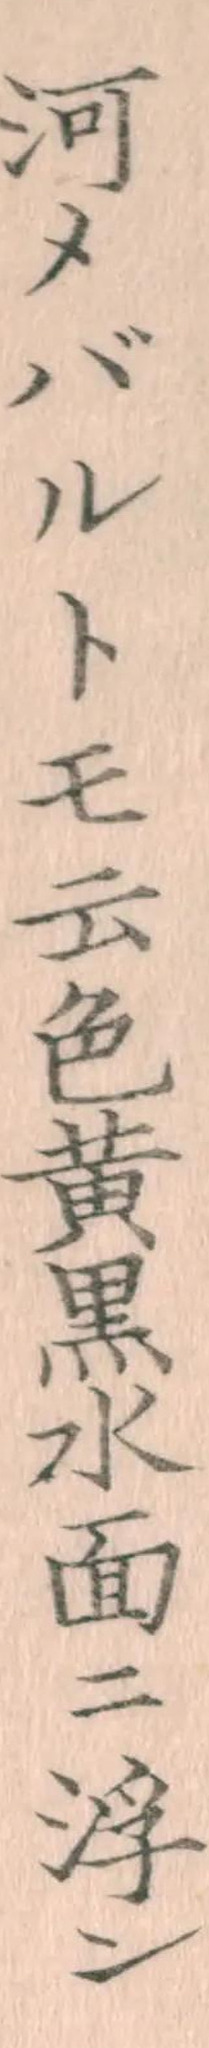河メバルトモ云色黄黒水面ニ浮ン
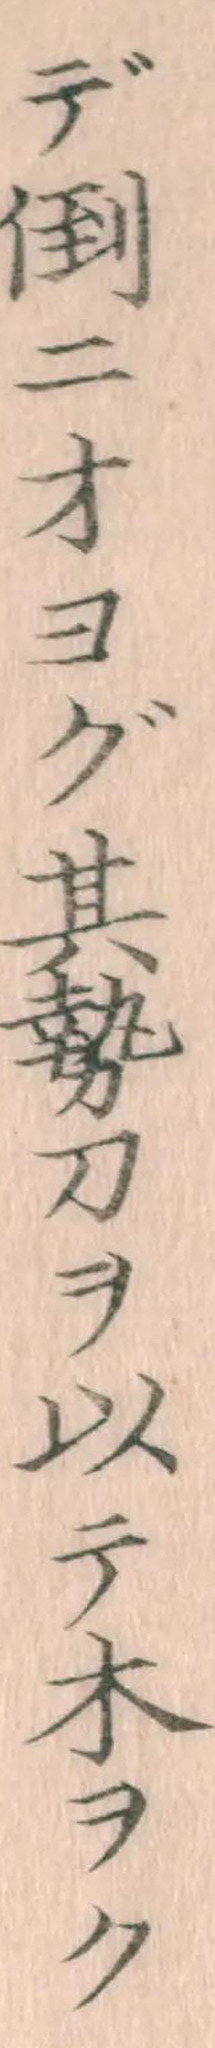デ倒ニオヨグ其勢刀ヲ以テ木ヲク
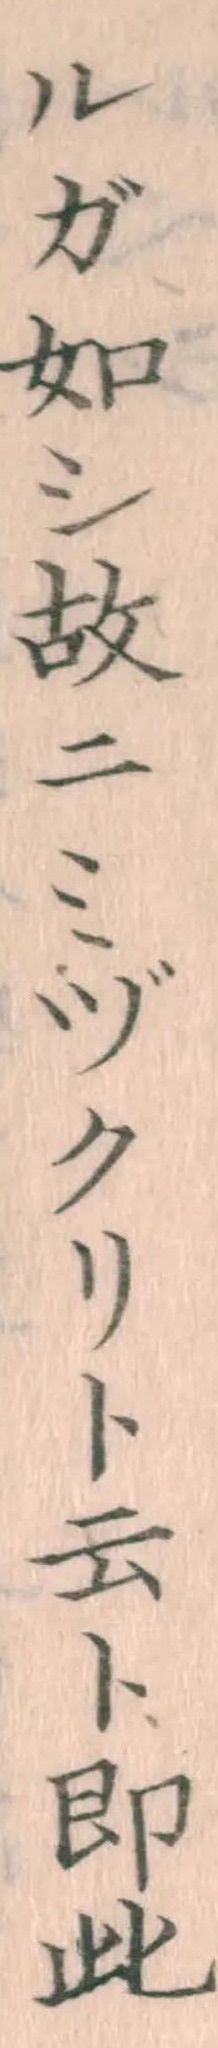ルガ如シ故ニミヅクリト云ト即此
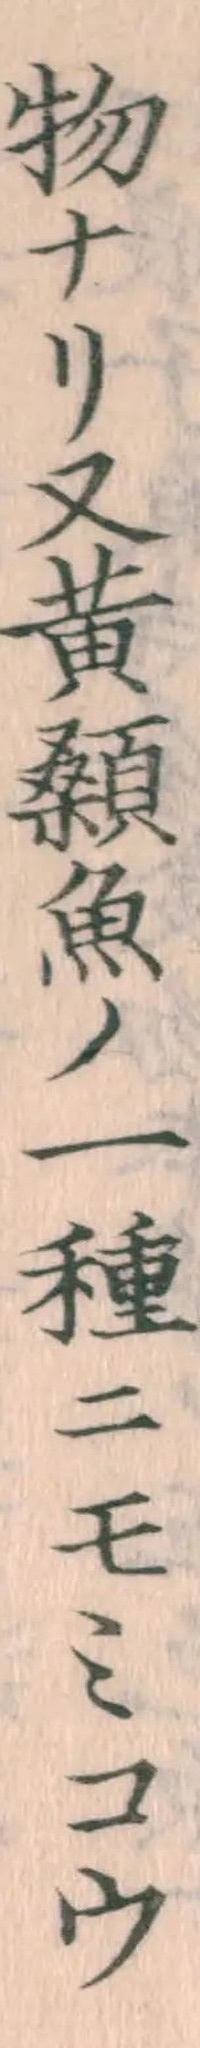物ナリ又黄顙魚ノ一種ニモミコウ
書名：皇和魚譜 2巻
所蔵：国立国会図書館 National Diet Library, JAPAN
